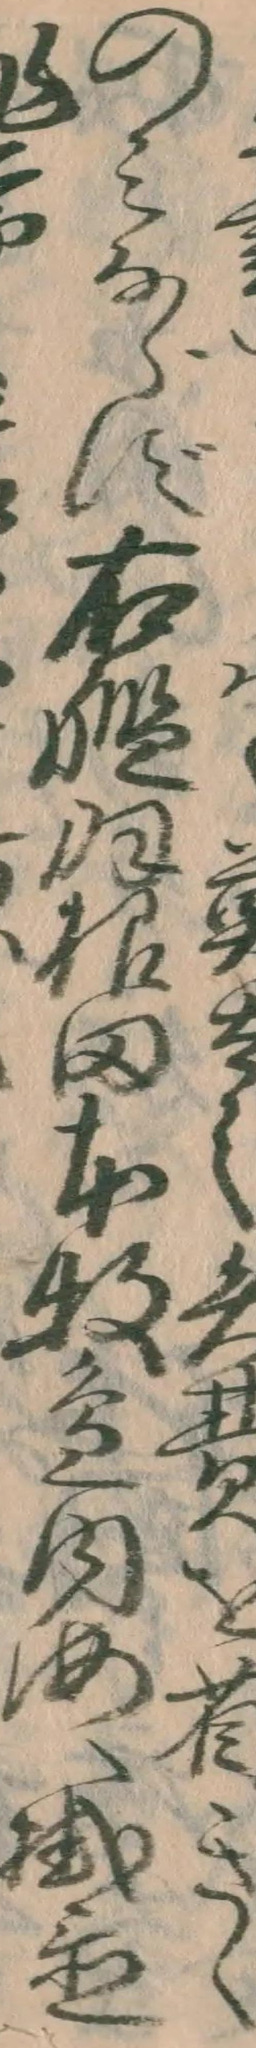のミならず右艦羽根田本牧邊内海へ掛置
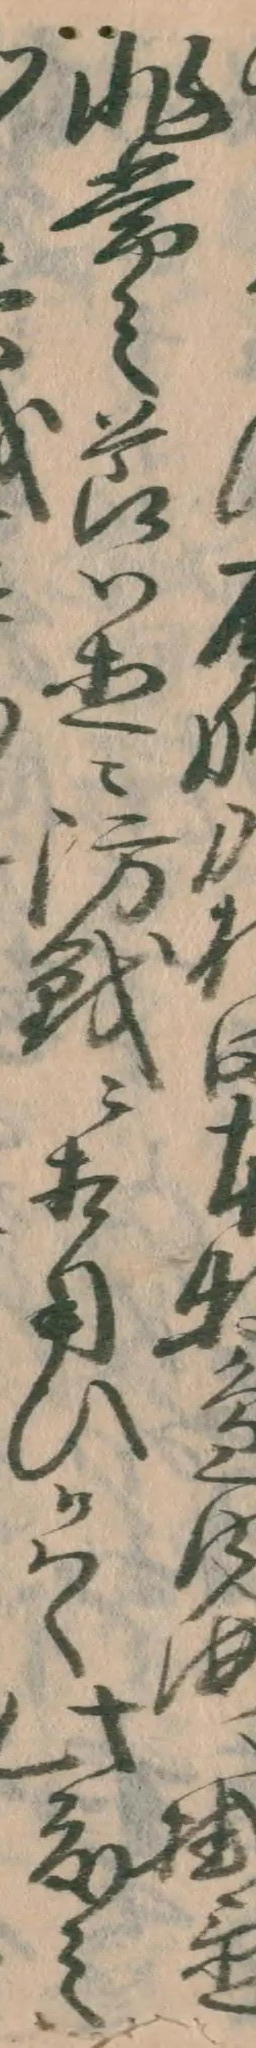非常之節ハ直ニ防戦ニ相用ひ候ハヽ此度之
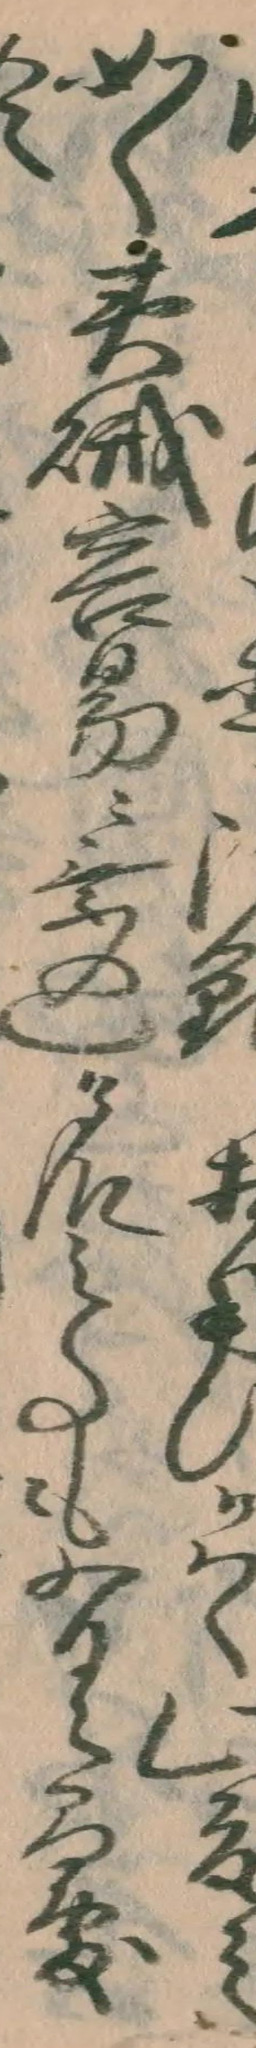如く夷賊容易ニ乗込候様之事も有之間敷
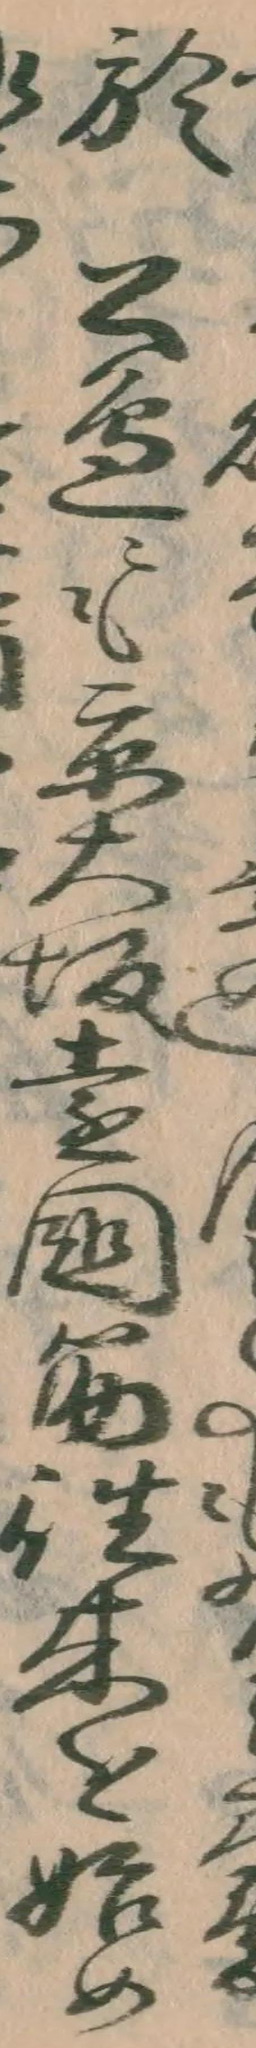於公邊ニも京大坂遠国筋往来を始め
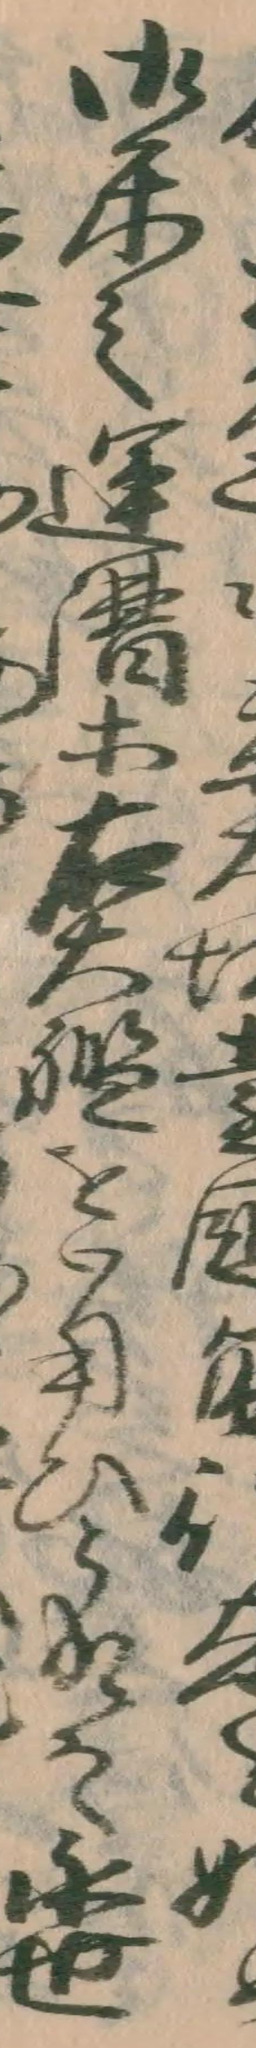御米之運漕等右大艦を御用ひと成候ハヽ永世
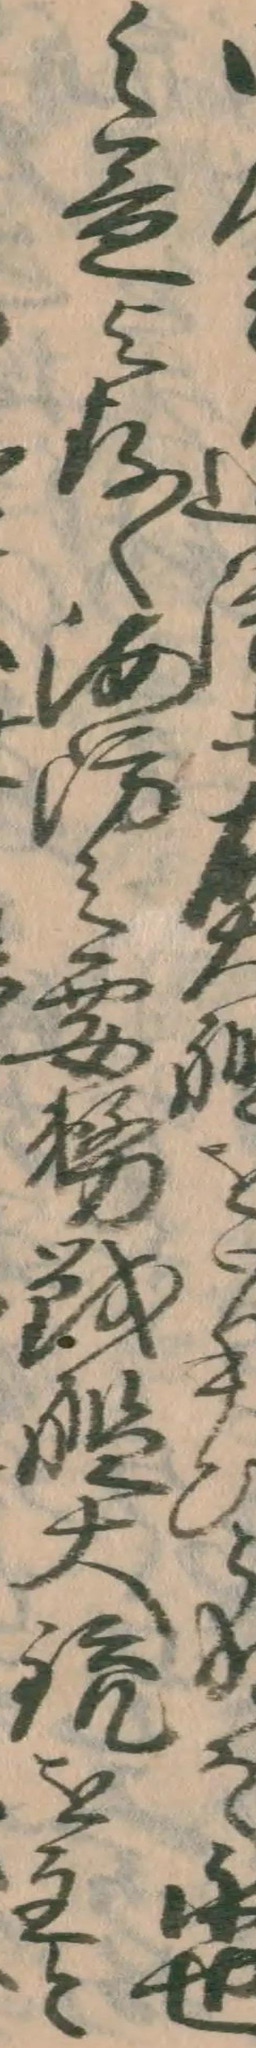之益と存候海防要務戦艦大銃を主と
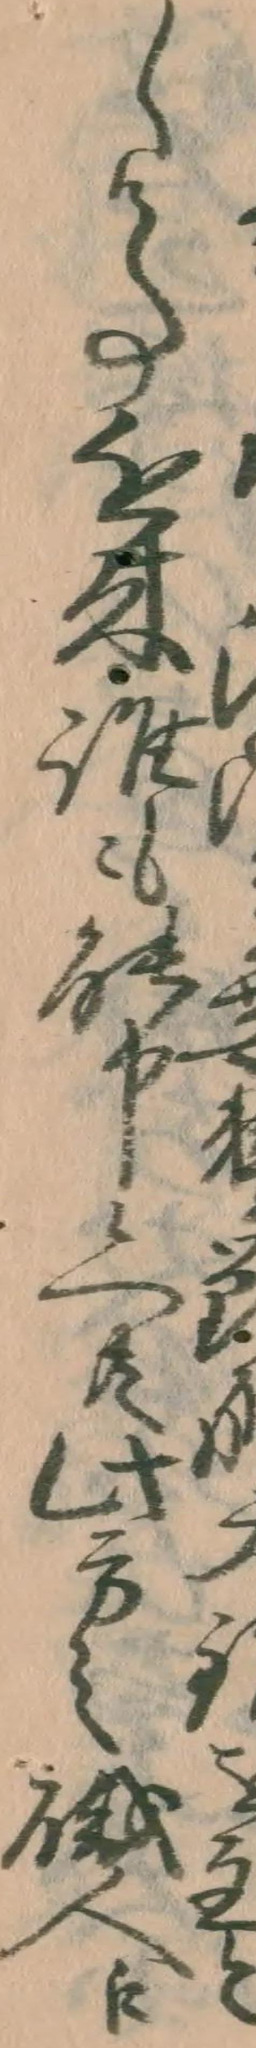し候事近来誰も能申候へ共此方之職人江
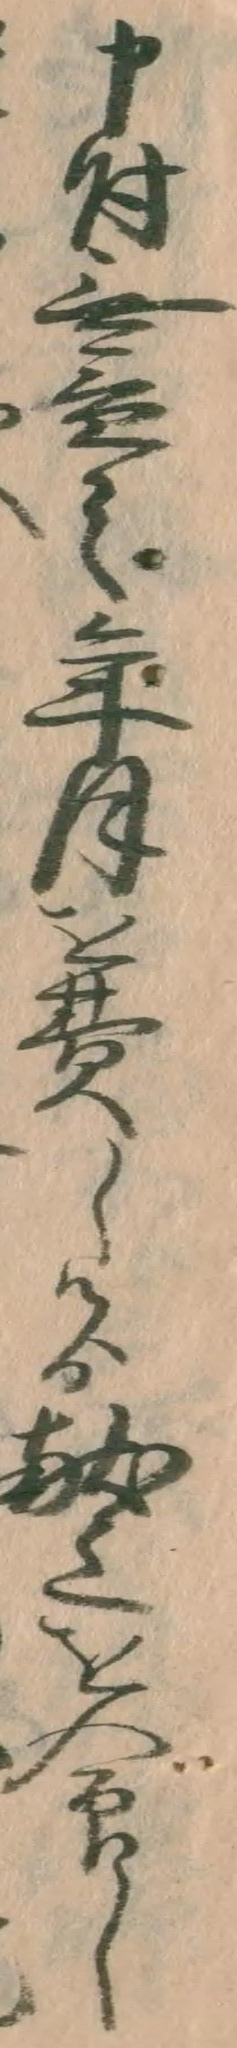申付無益之年月を費し候ゟ献上を命し
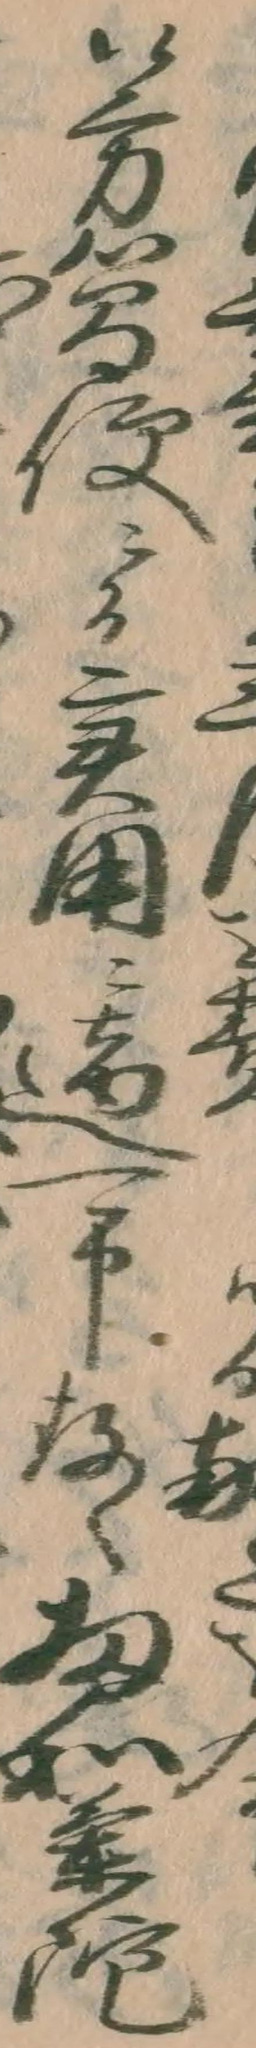候方簡便ニ而実用ニ適可申存候扠和蘭陀
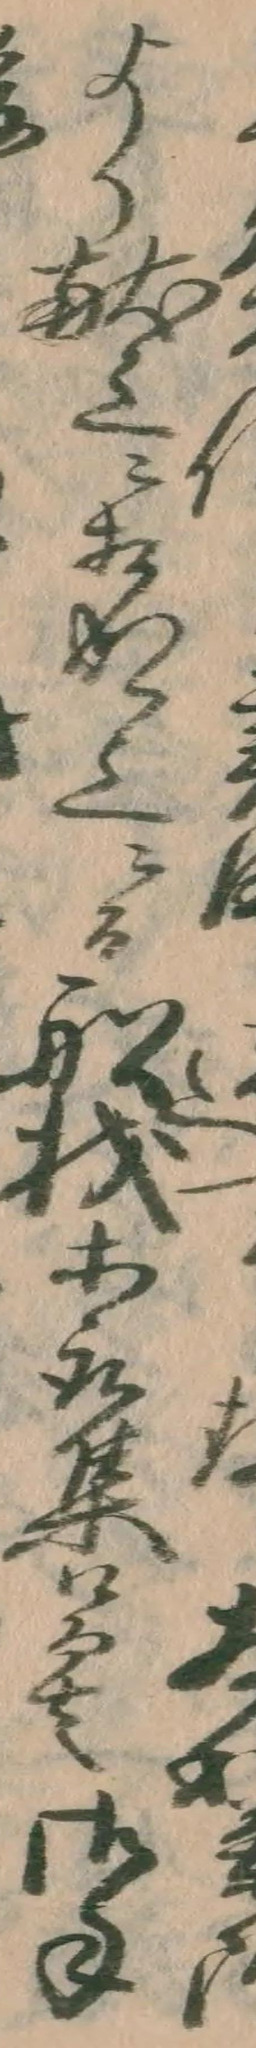より献上ニ相成上ニ而船材等取集候而者御手
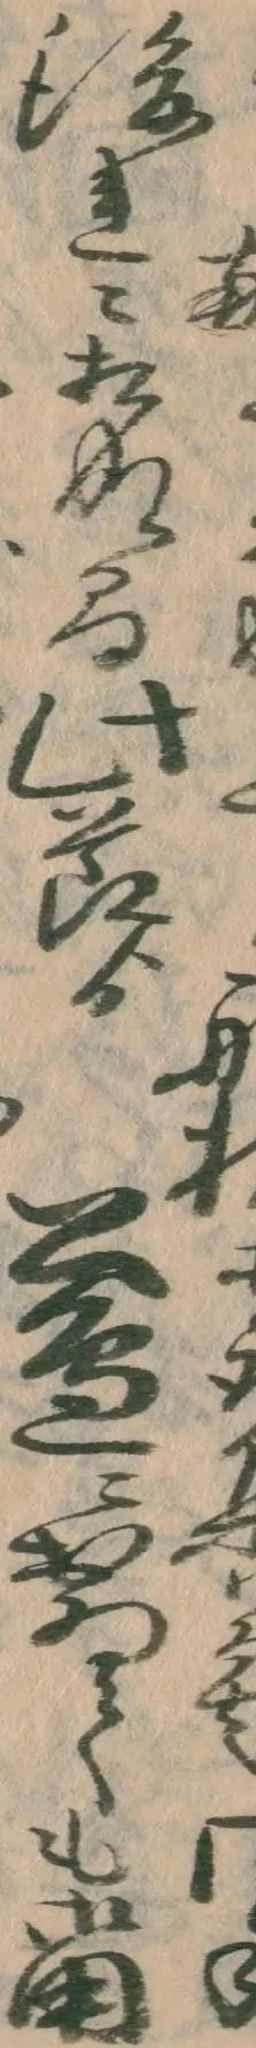後れニ相成候間此節ゟ公邊ニおゐても御用
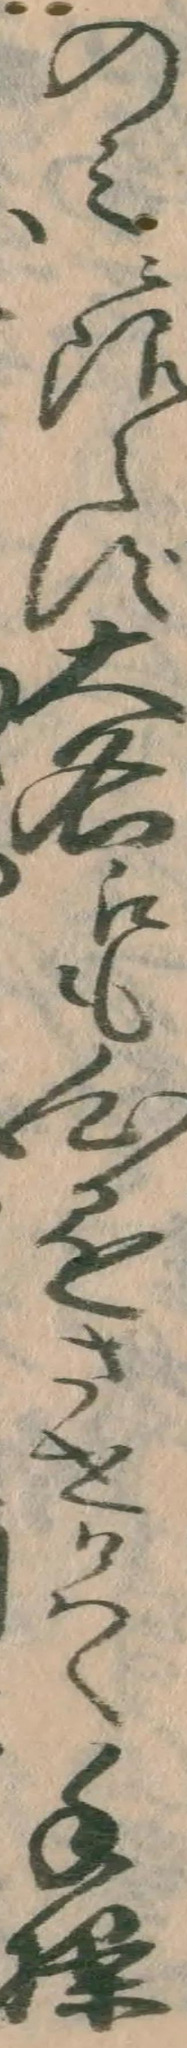のミにニ限らず大名江も心懸させ候ハヽ手繰
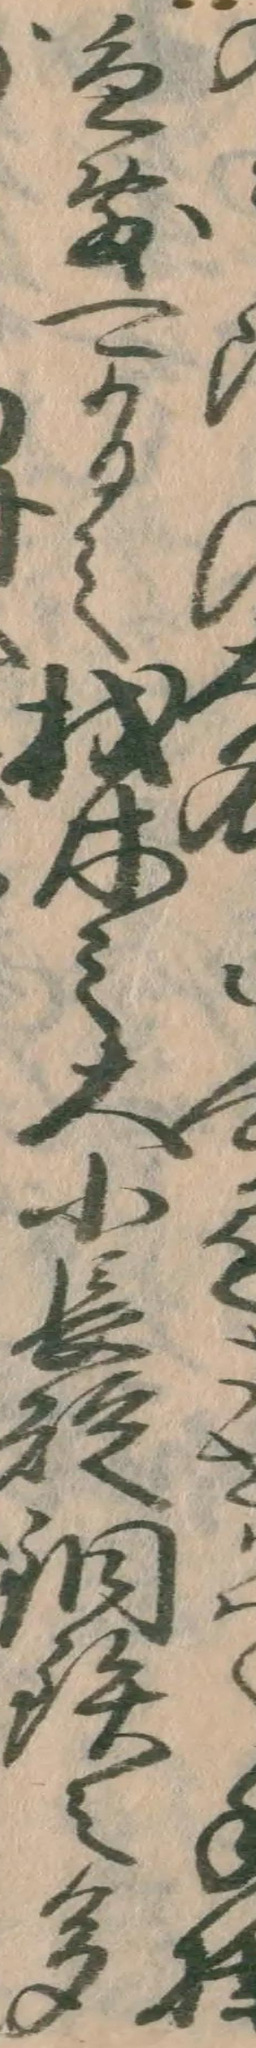宜敷可有之材木之大小長短銅鉄之多
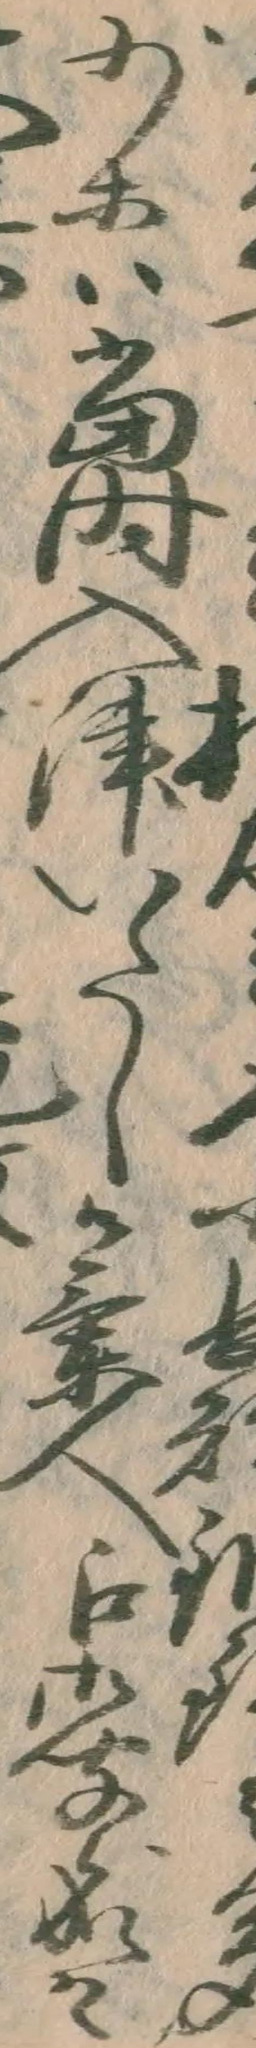少等ハ當時入津いたし候蘭人江御聞被成候ハヽ
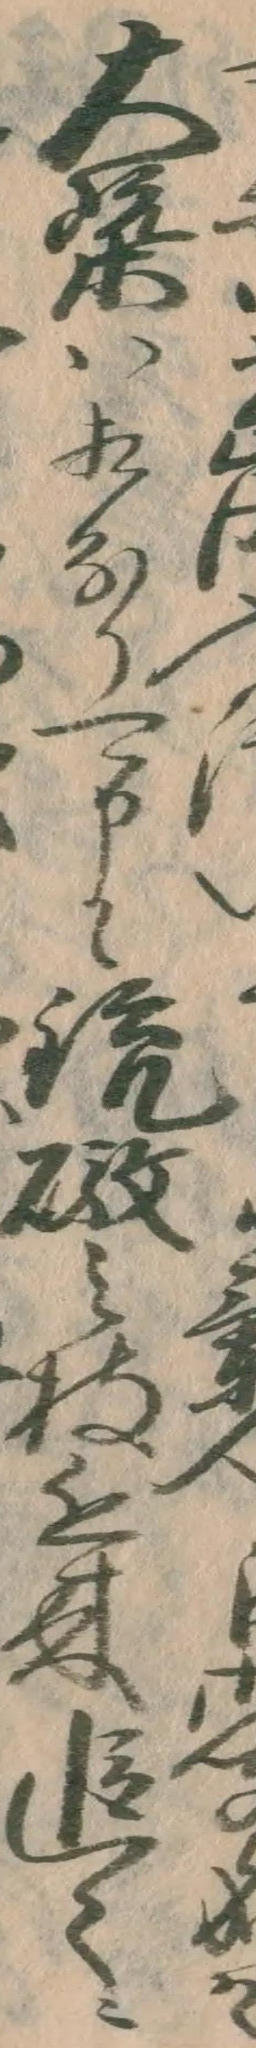大概ハ相分り可申候銃礮之技近来追々ニ
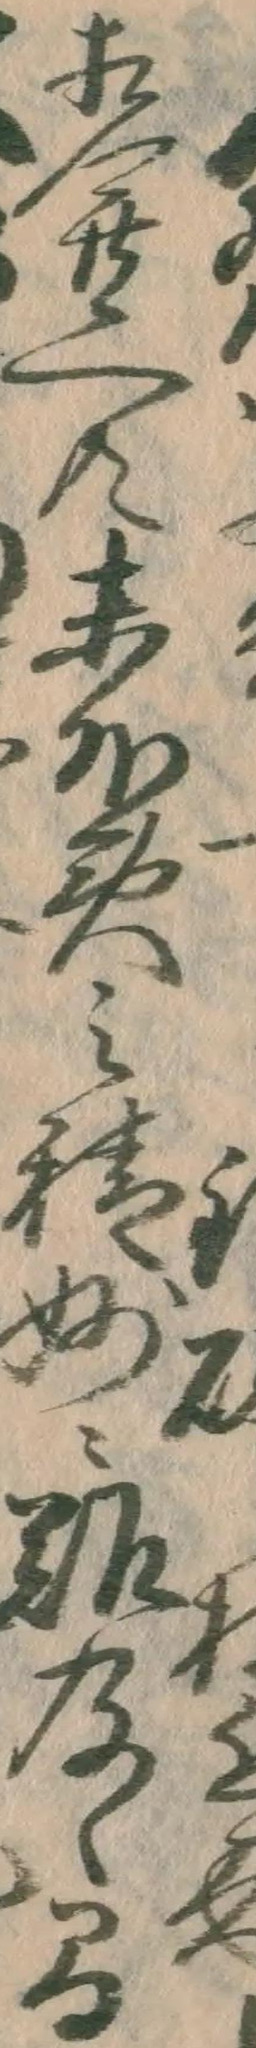相開候へ共未外夷之精妙ニ難及候間
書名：麗斎叢書. 20
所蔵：国立国会図書館 National Diet Library, JAPAN
